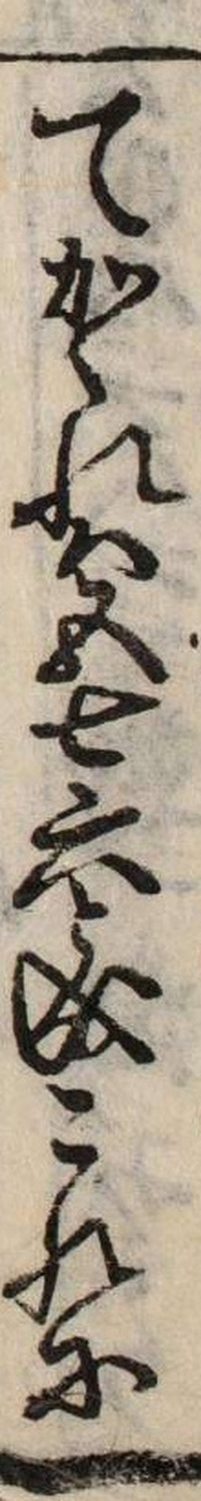てかくれは五七六と成これに
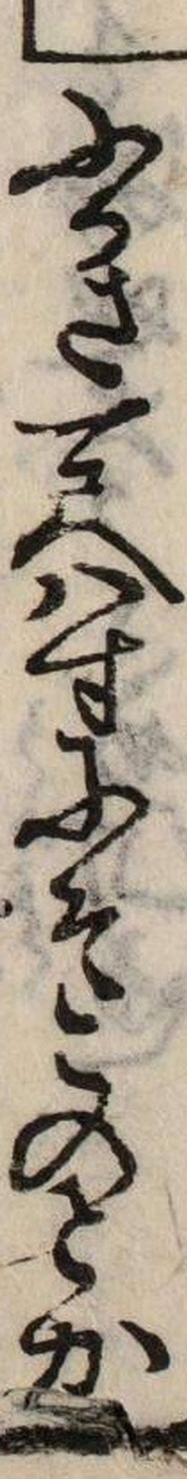ふかさ一尺八寸にそこのとか
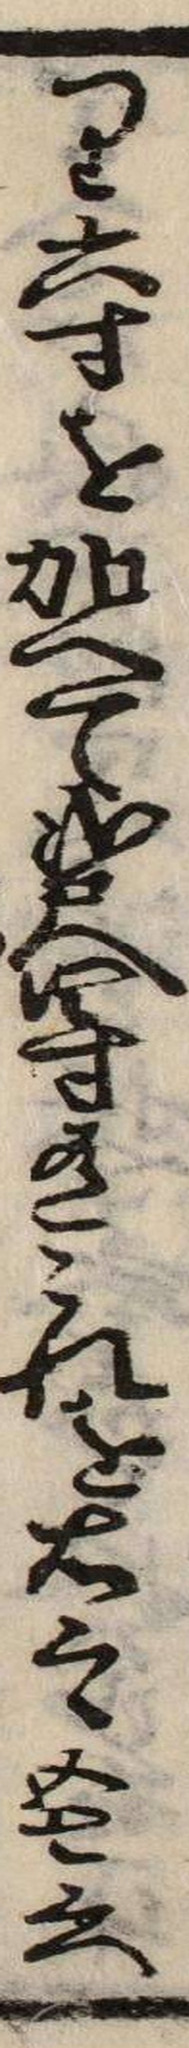り六寸を加へて弐尺四寸有これを右之五七六
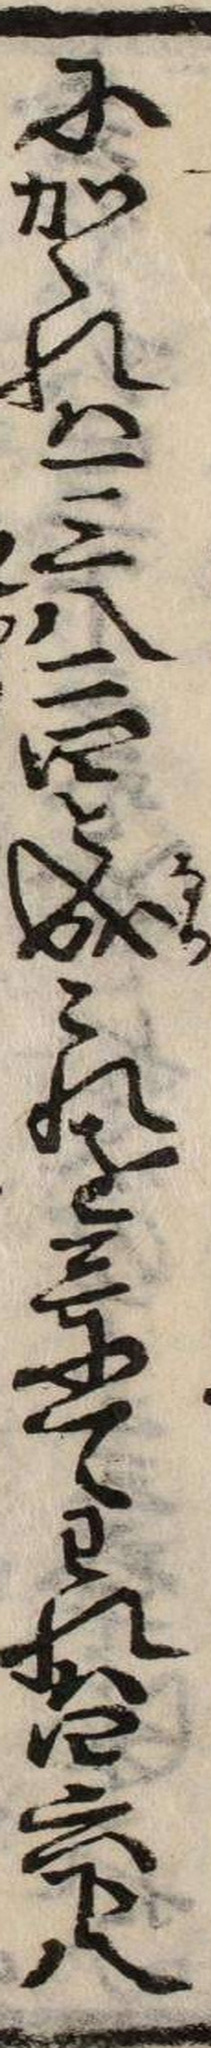にかくれは一三八二四と成これを三にてわれは四六下八
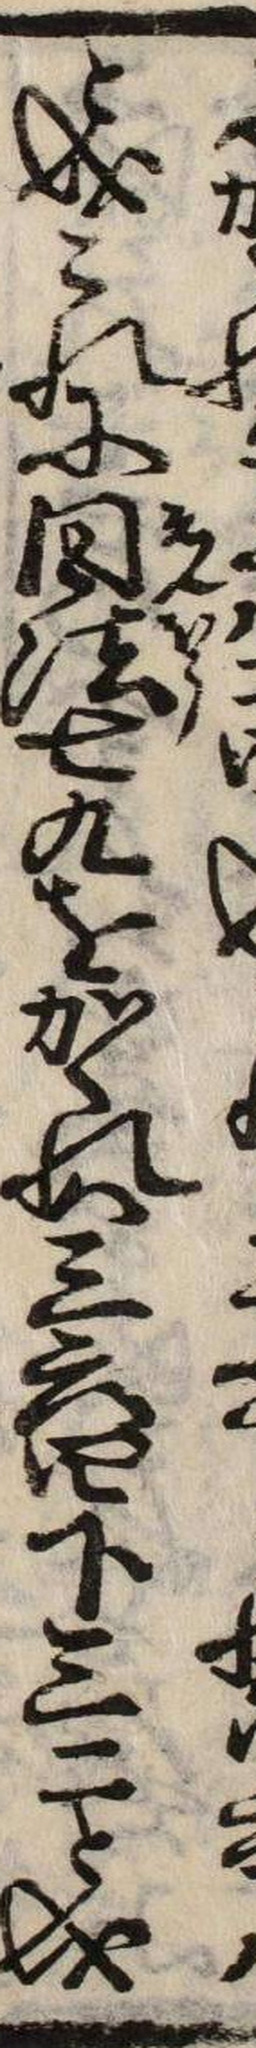と成これに円法七九をかくれは三六四下三二と成
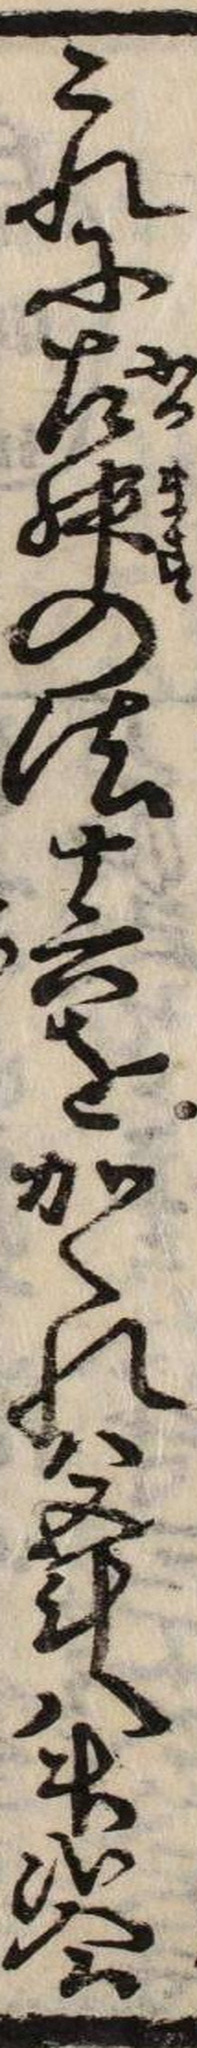これに古舛の法十六をかくれは五斗八升弐合
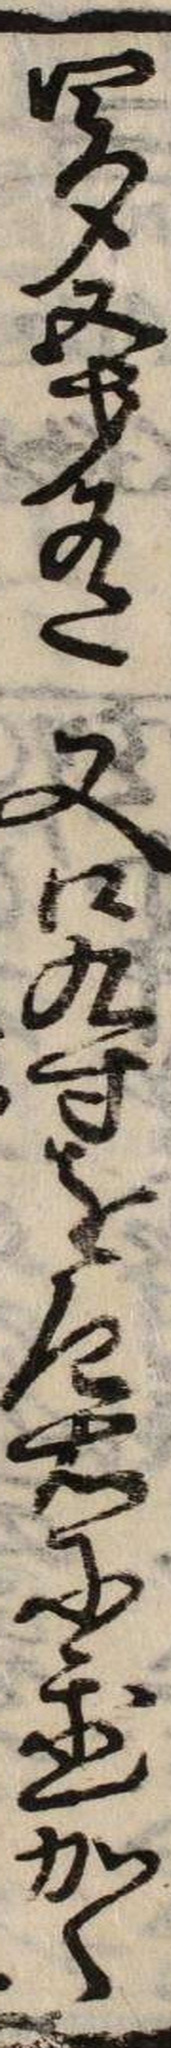四夕五才有又口九寸を左右に置かく
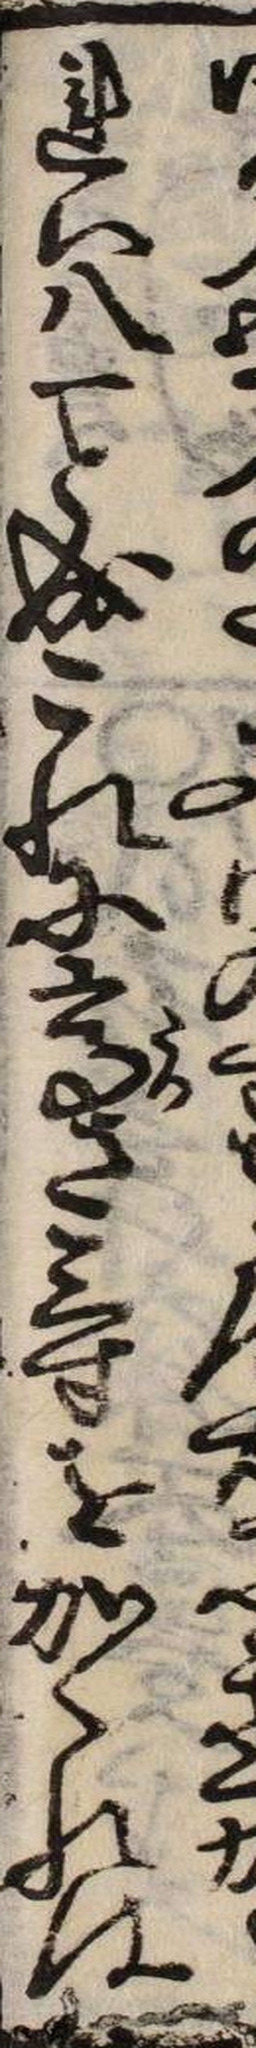れは八一と成これに高さ三寸をかくれは
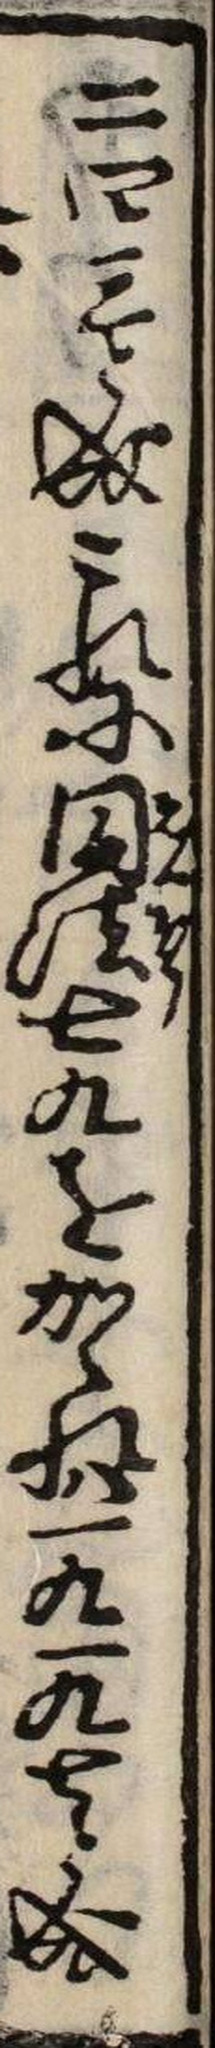二四三と成これに円法七九をかくれは一九一九七と成
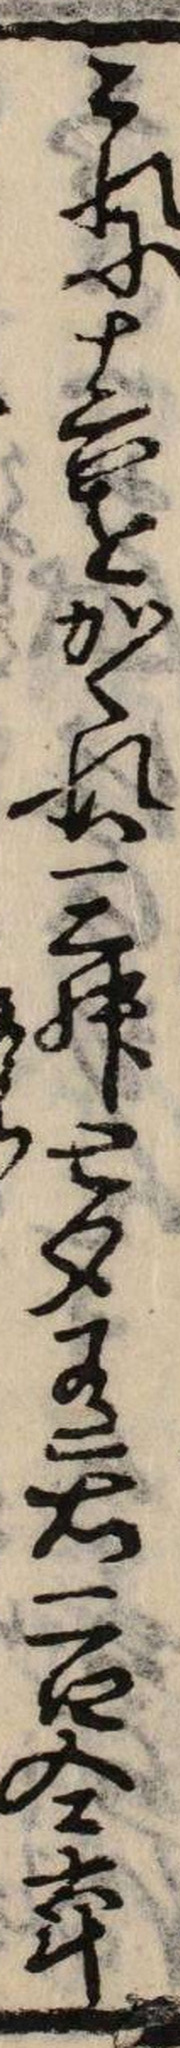これに十六をかくれは三升七勺有右二石合六斗
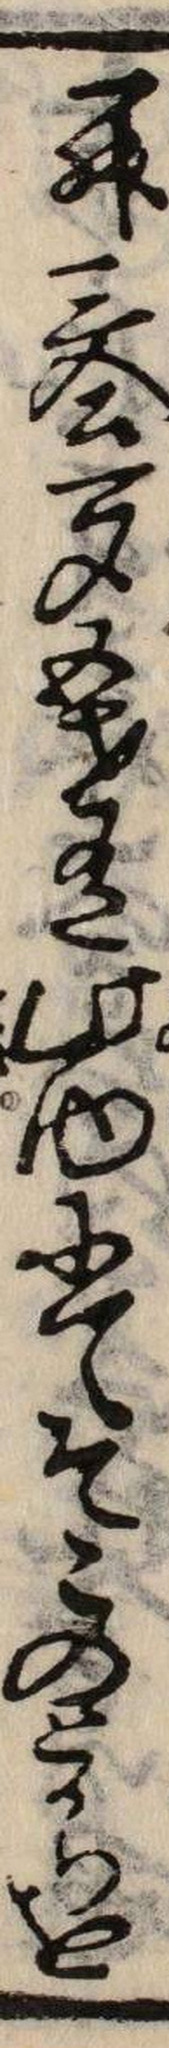一升三合一勺五才有此内にてこのとかりを
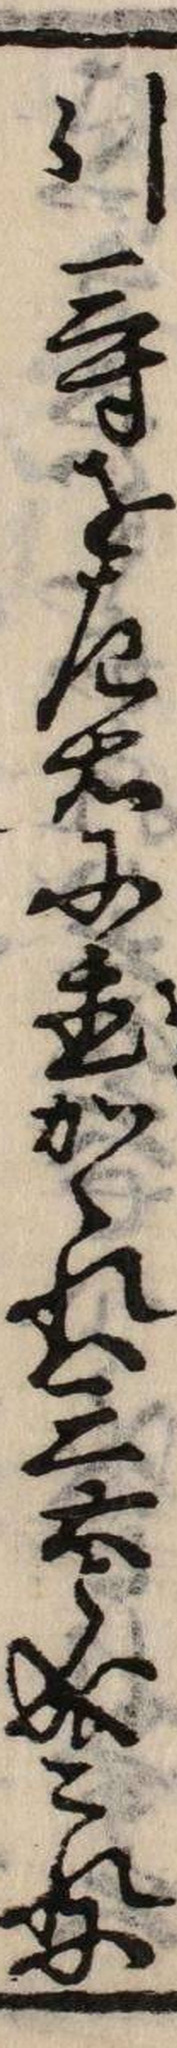引三寸を左右に置かくれは三六と成これに
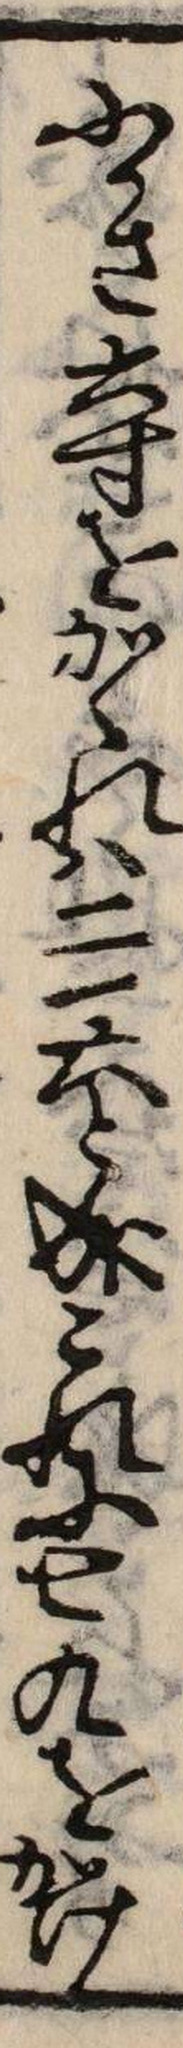ふかさ六寸をかくれは二一六と成これに七九をかけ
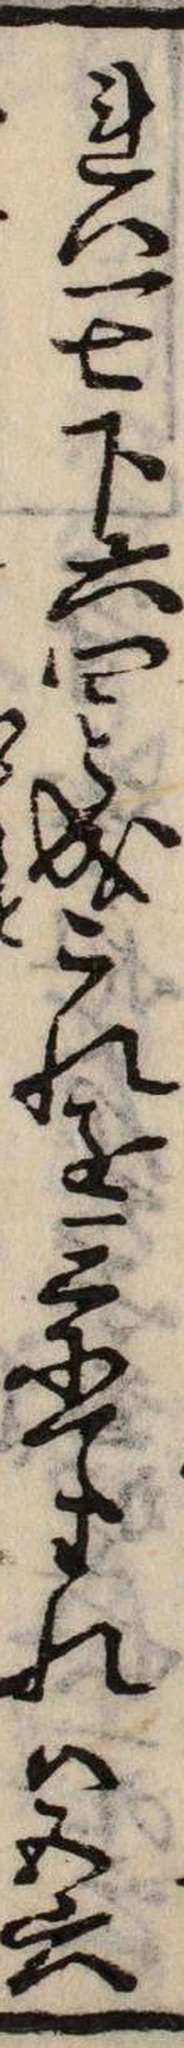れは一七下六四と成これを三にてわれは五六
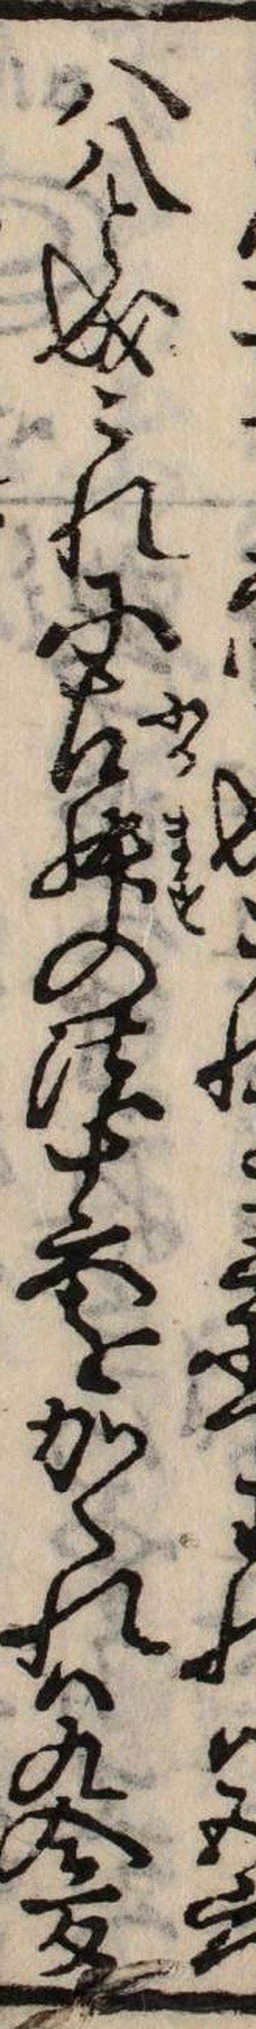八八と成これに古舛の法十六をかくれは九合一勺
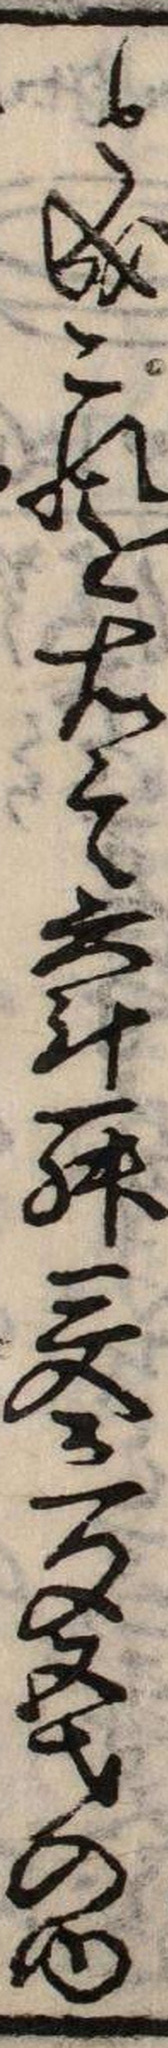と成これを右之六斗一升三合一勺五才の内
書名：塵劫記（寛永11年自跋、京都府立京都学・歴彩館追貴8）
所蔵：京都府立京都学・歴彩館 国文学研究資料館
